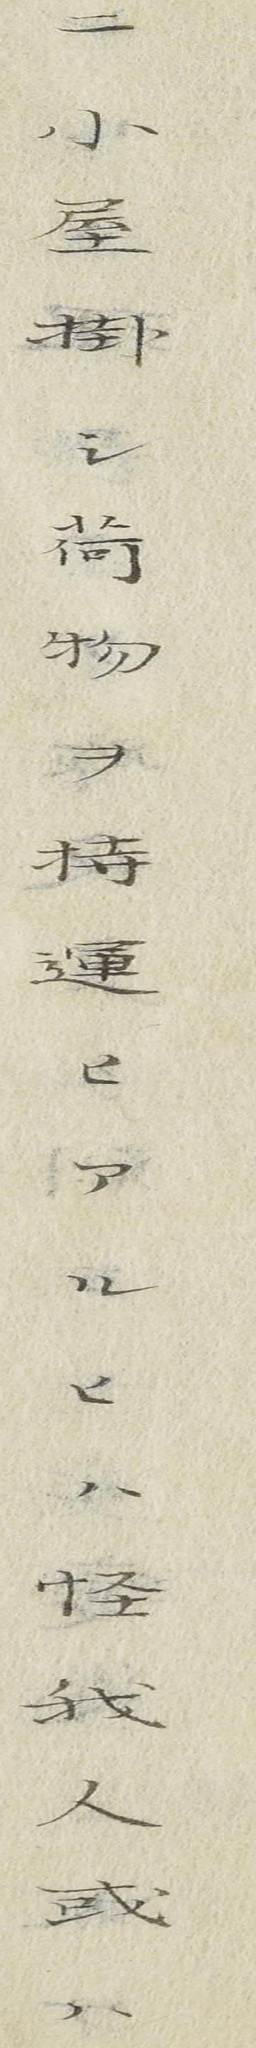ニ小屋掛シ荷物ヲ持運ヒアルヒハ怪我人或ハ
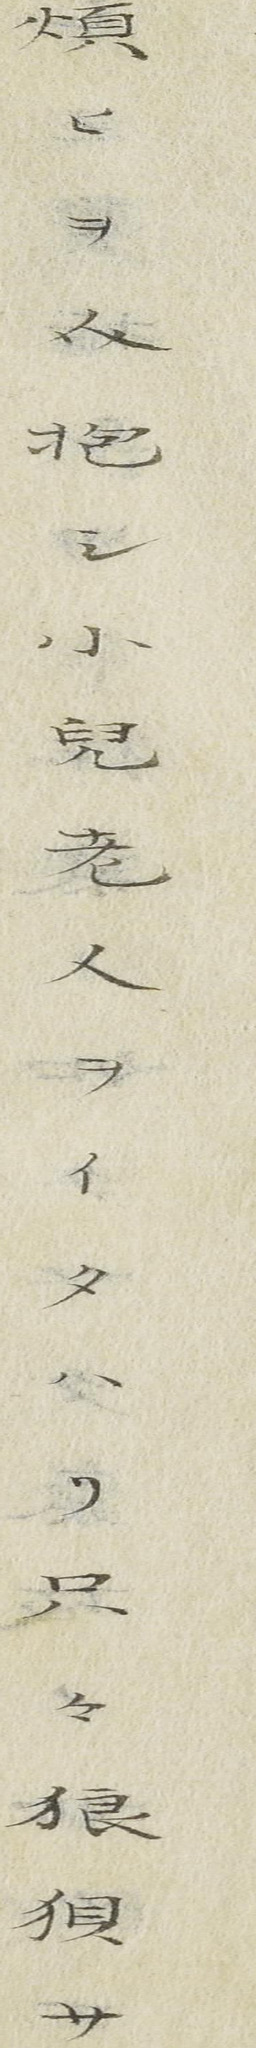煩ヒヲ介抱シ小児老人ヲイタハリ只々狼狽サ
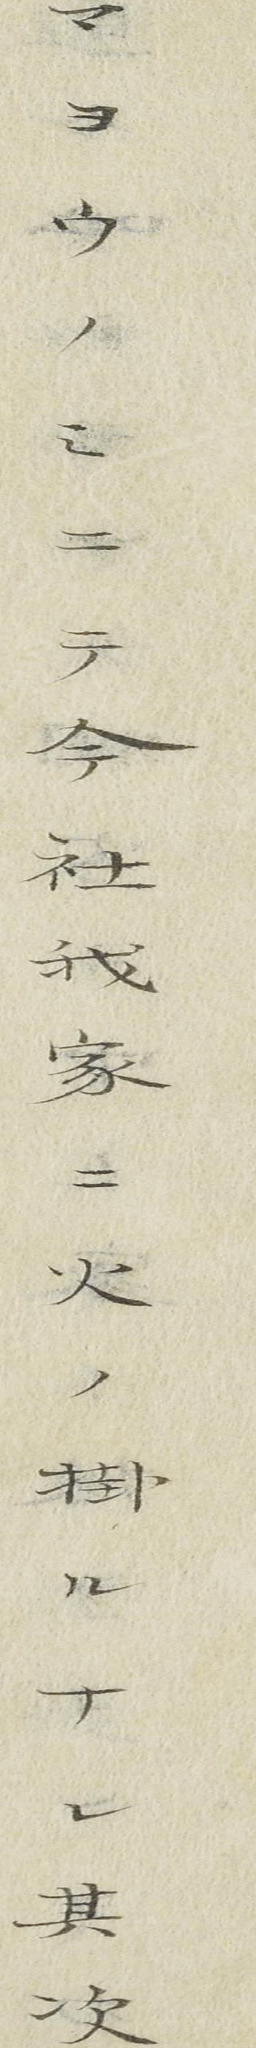マヨウノミニテ今社我家ニ火ノ掛ルナレ其次
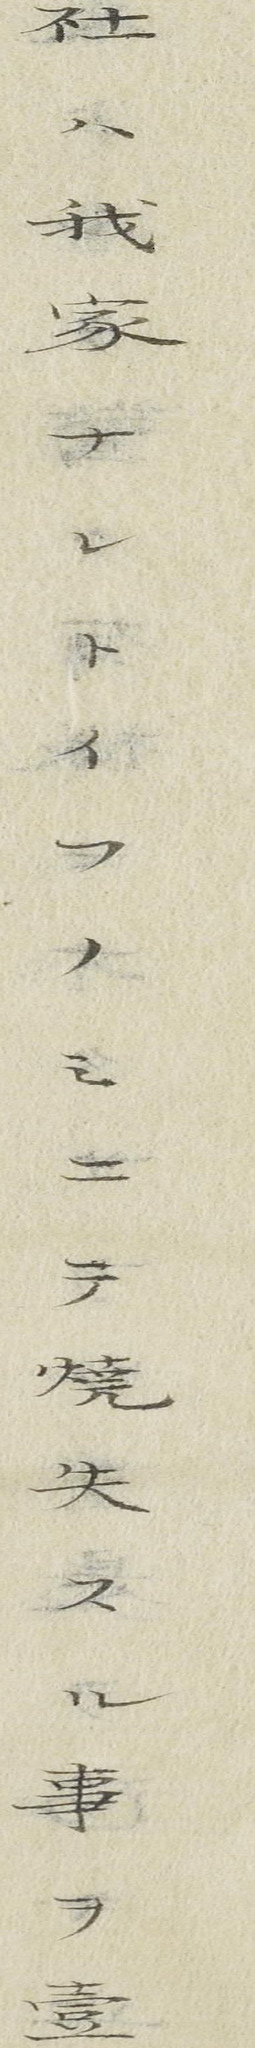社ハ我家ナレトイフノミニテ焼失スル事ヲ壹

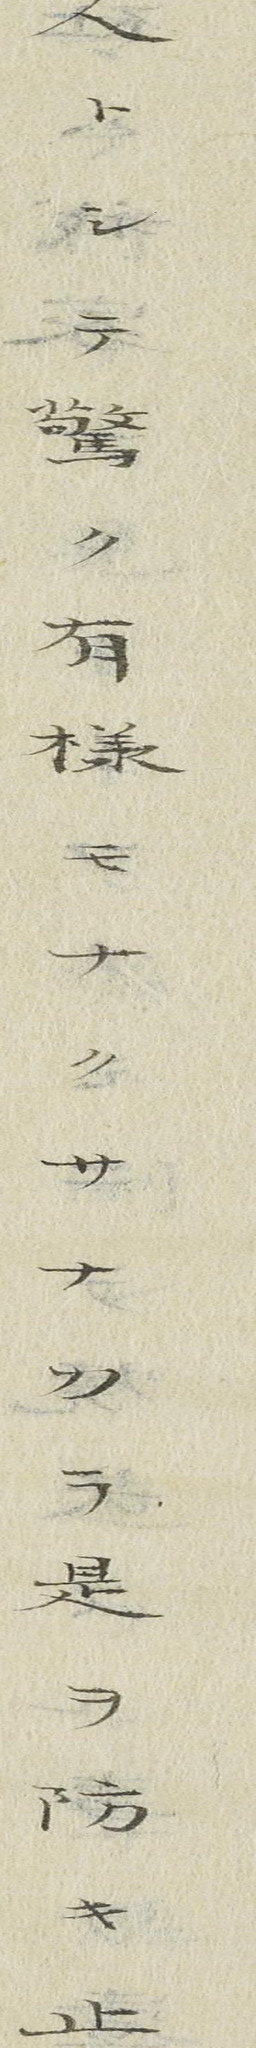人トシテ驚ク有様モナクサナカラ是ヲ防キ止
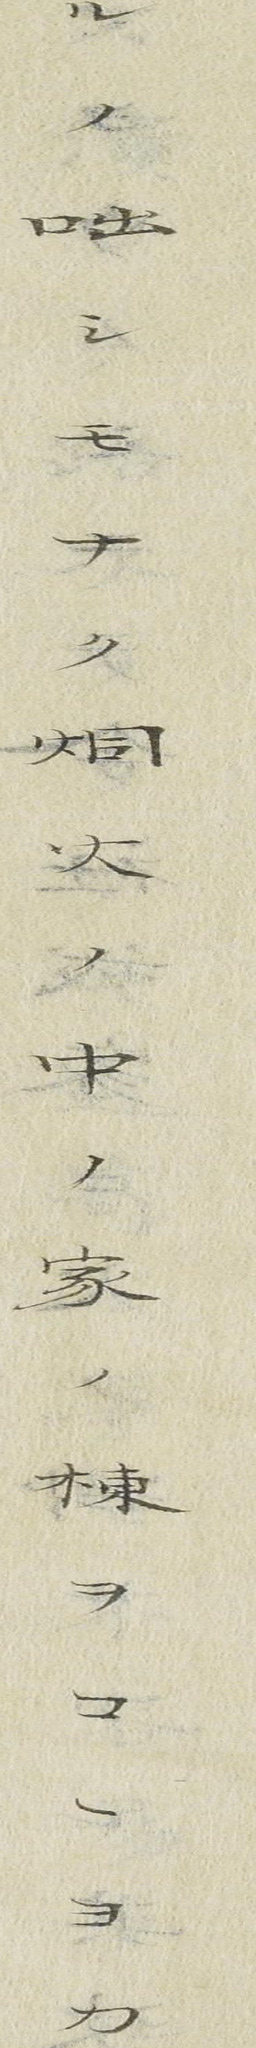ルノ咄シモナク烟火ノ中ノ家ノ棟ヲコヽヨカ
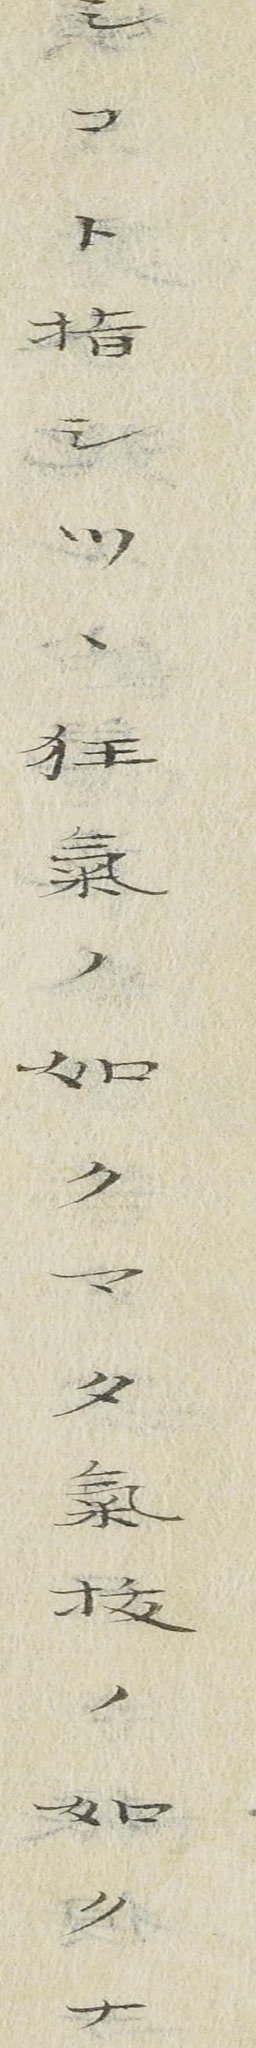シコト指シツヽ狂気ノ如クマタ気抜ノ如クナ
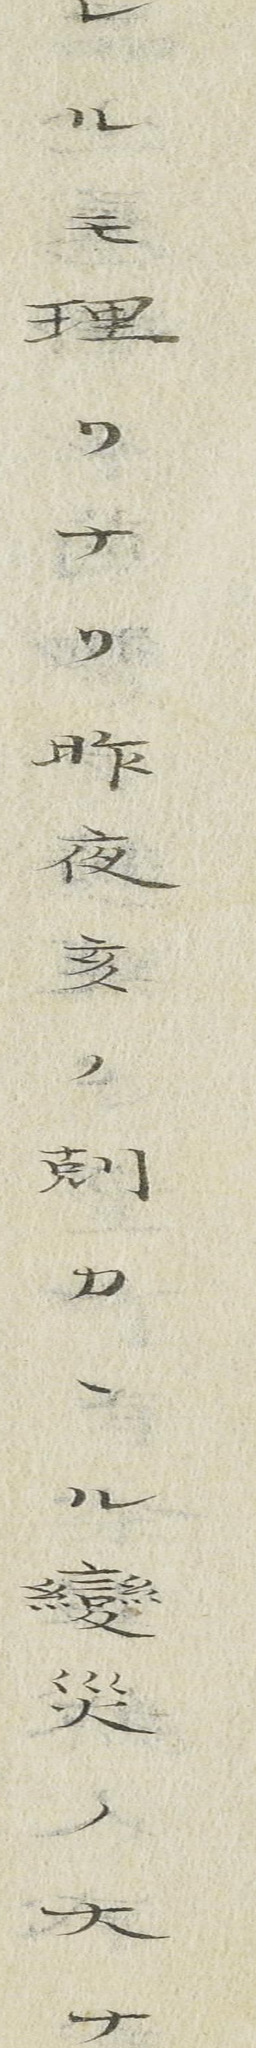レルモ理リナリ昨夜亥ノ刻カヽル変災ノ大ナ
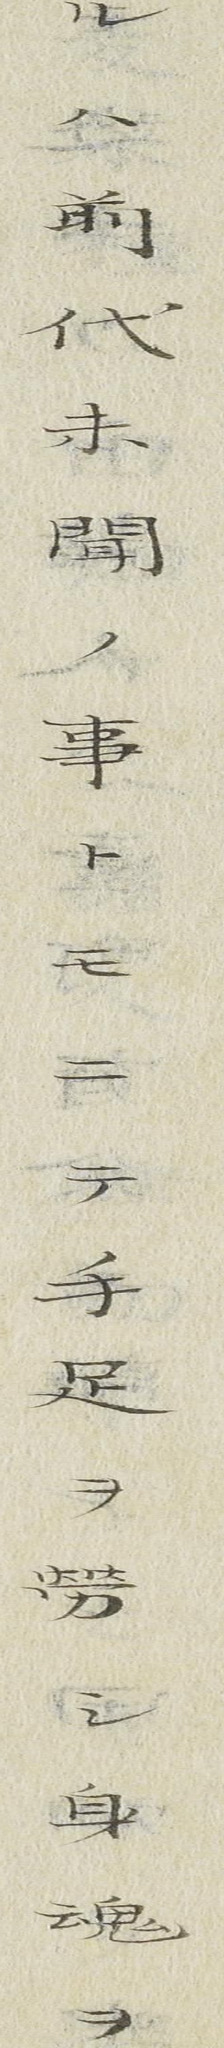ルハ前代未聞ノ事トモニテ手足ヲ労シ身魂ヲ
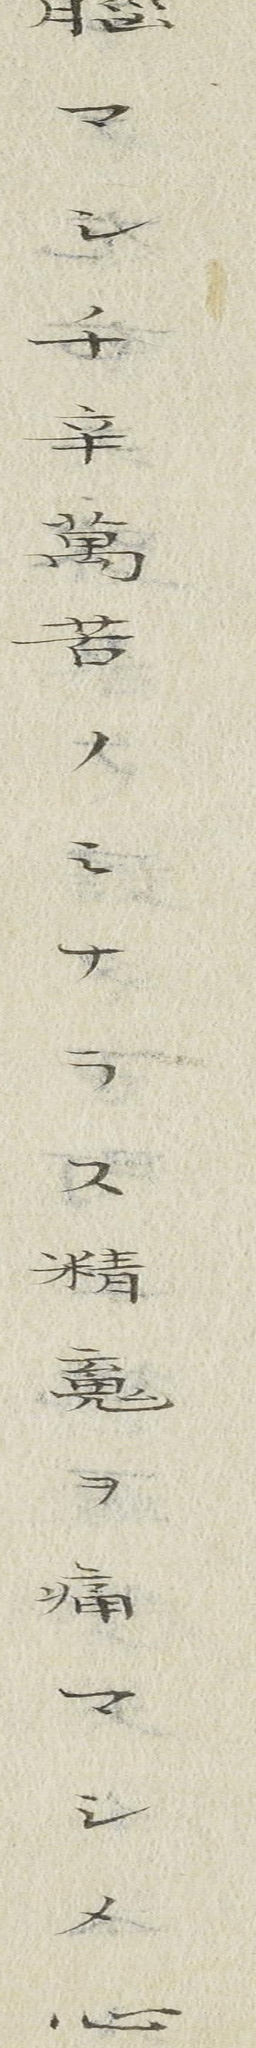脳マシ千辛万苦ノミナラス精魂ヲ痛マシメ心
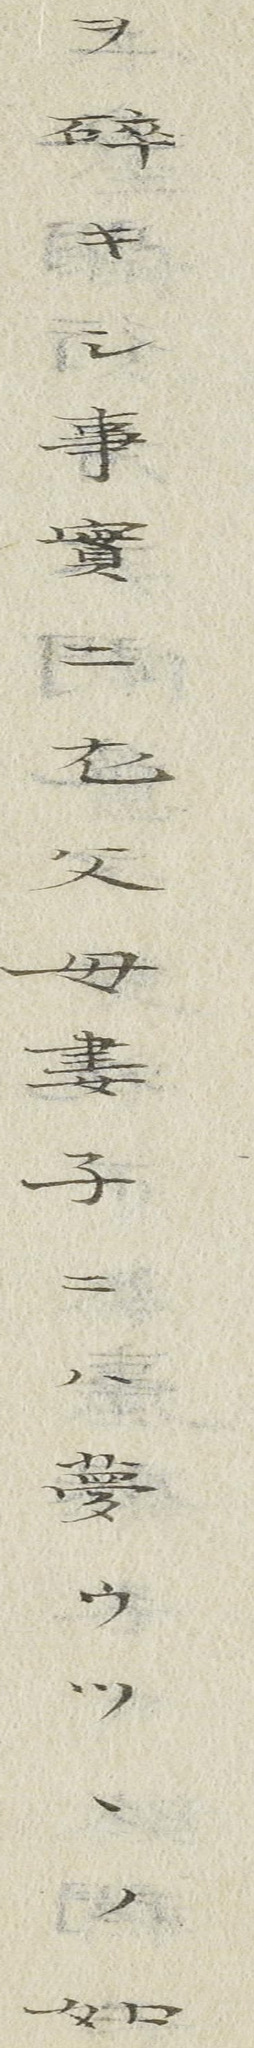ヲ砕キシ事実ニ左父母妻子ニハ夢ウツヽノ如
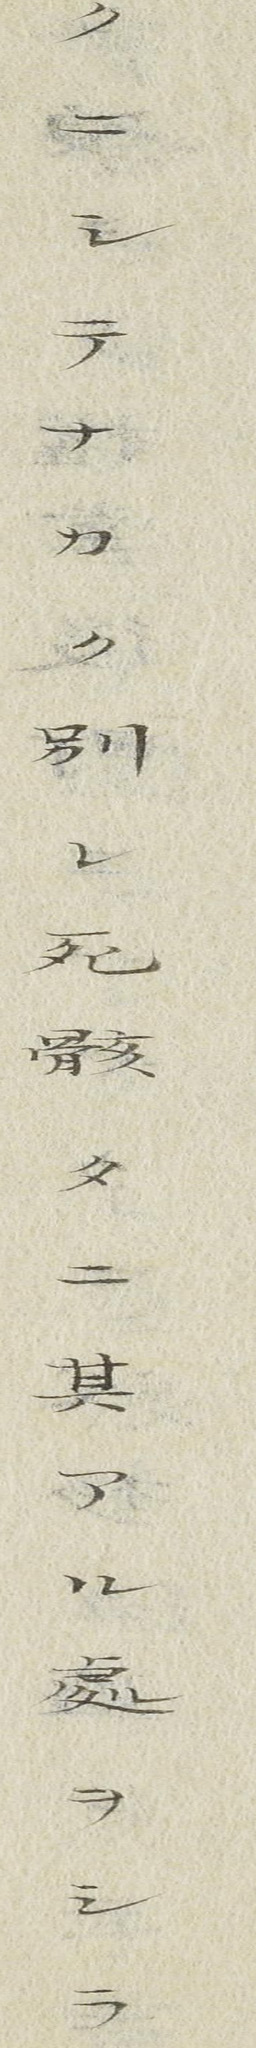クニシテナカク別レ死骸タニ其アル処ヲシラ
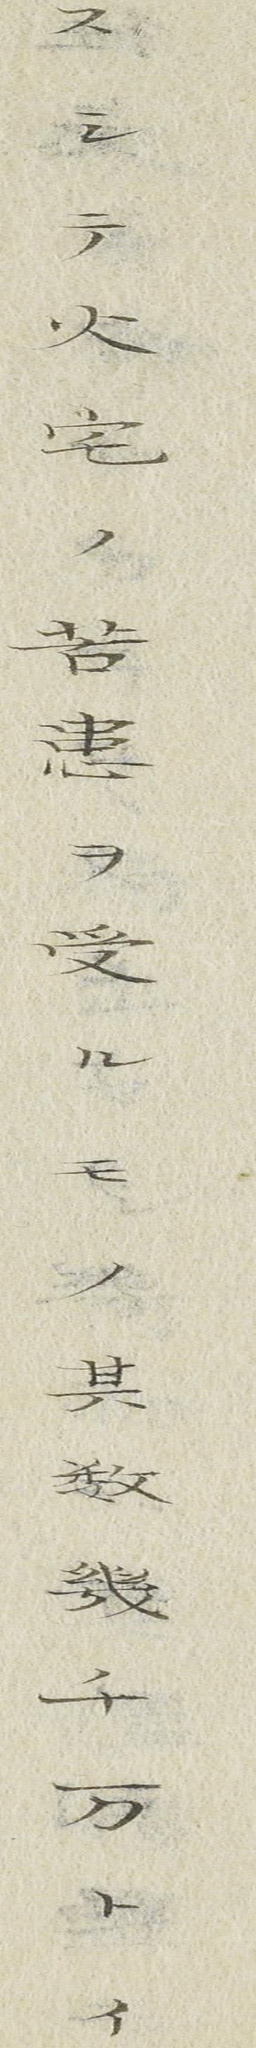スシテ火宅ノ苦患ヲ受ルモノ其数幾千万トイ
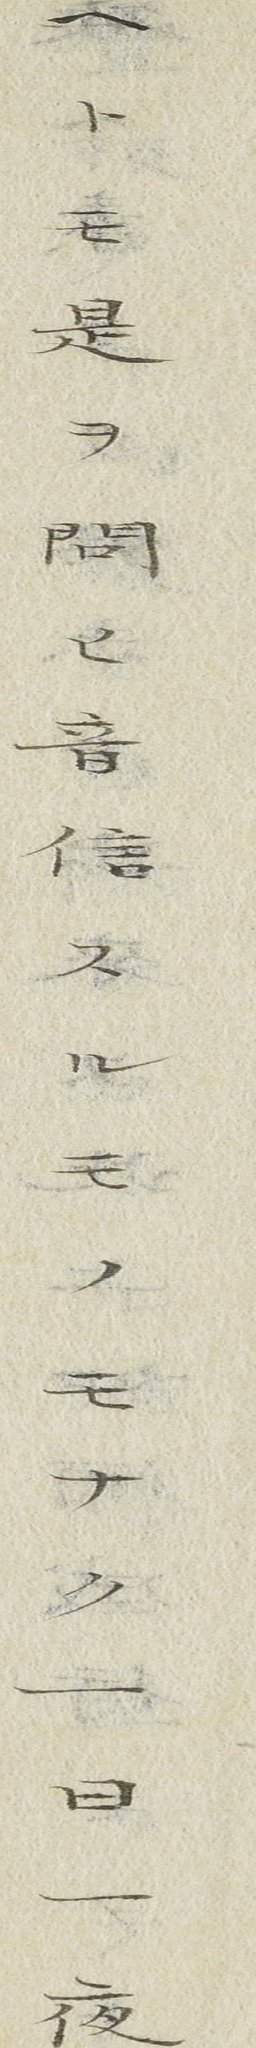ヘトモ是ヲ問ヒ音信スルモノモナク一日一夜
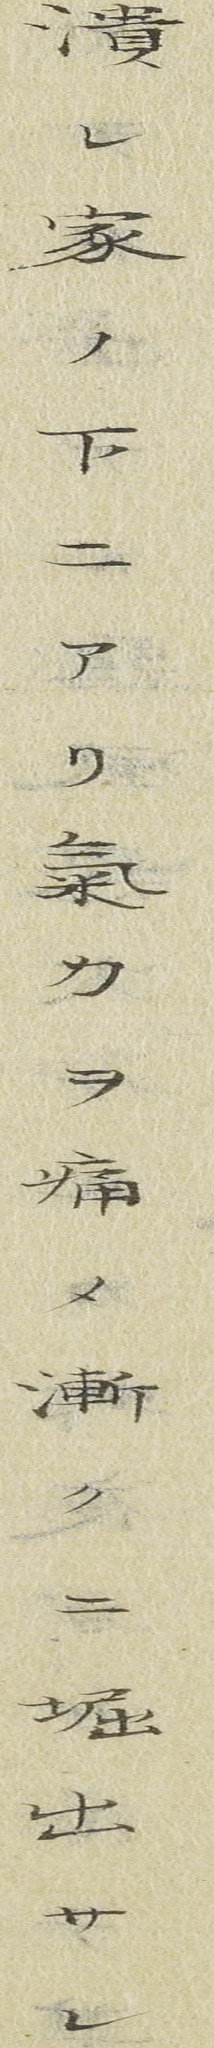潰レ家ノ下ニアリ気力ヲ痛メ漸クニ掘出サレ
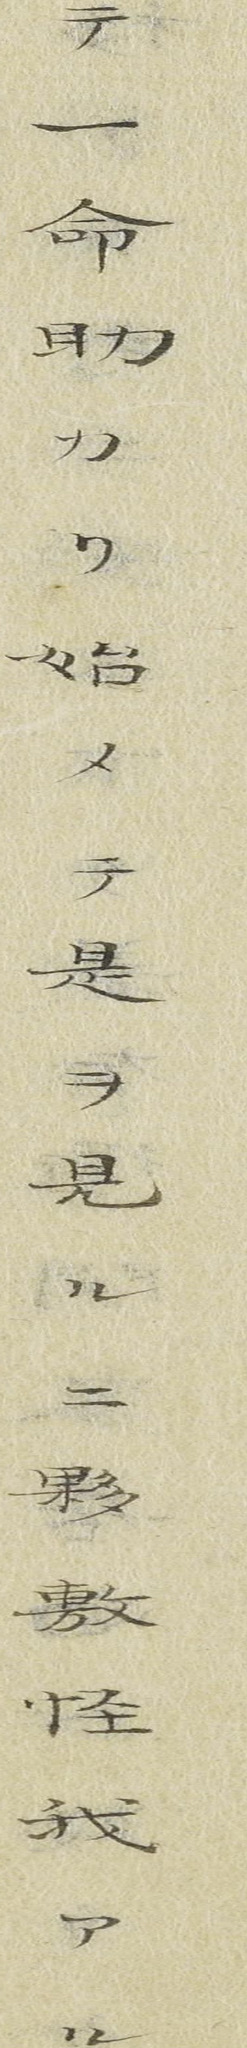テ一命助カリ始メテ是ヲ見ルニ夥敷怪我アル
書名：地災撮要　地震之部　巻ノ二
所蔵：東京大学地震研究所図書室 Earthquake Research Institute Library, The University of Tokyo, JAPAN
